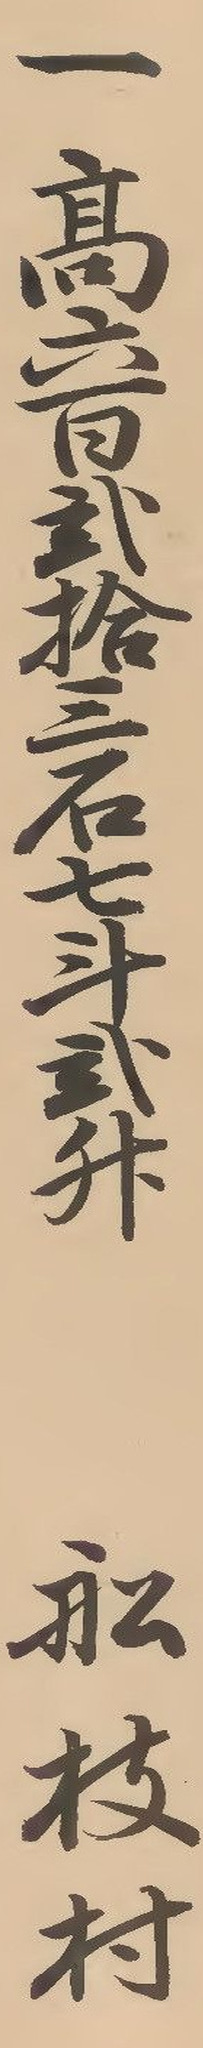一高六百弐拾三石七斗弐升船枝村
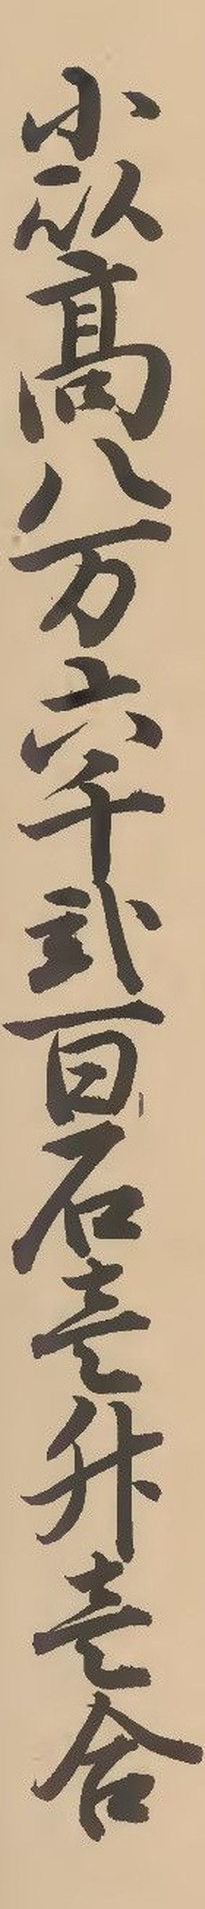小以高八万六千弐百石壱升壱合
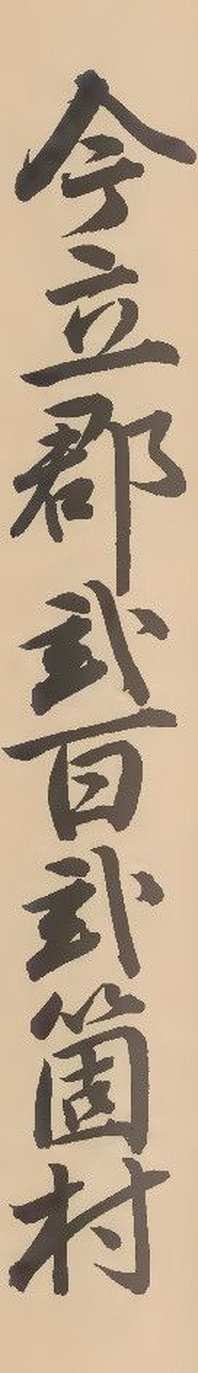今立郡弐百弐箇村

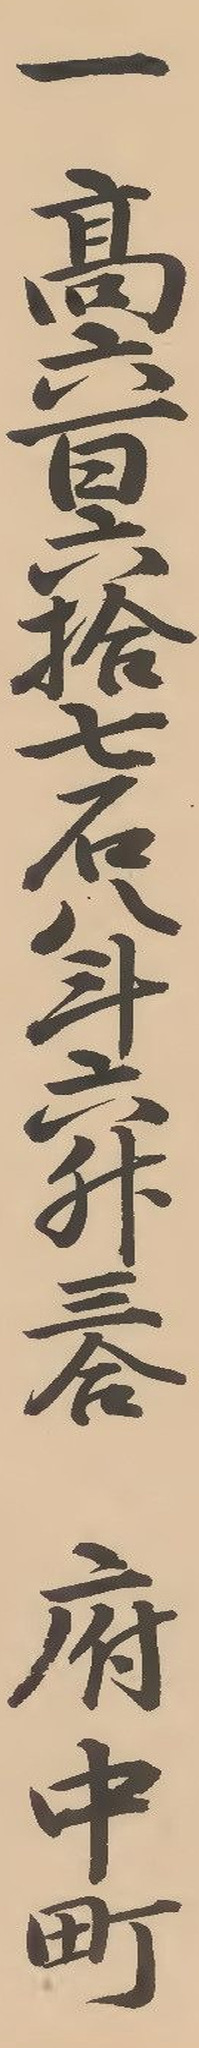一高六百六拾七石八斗六升三合府中町
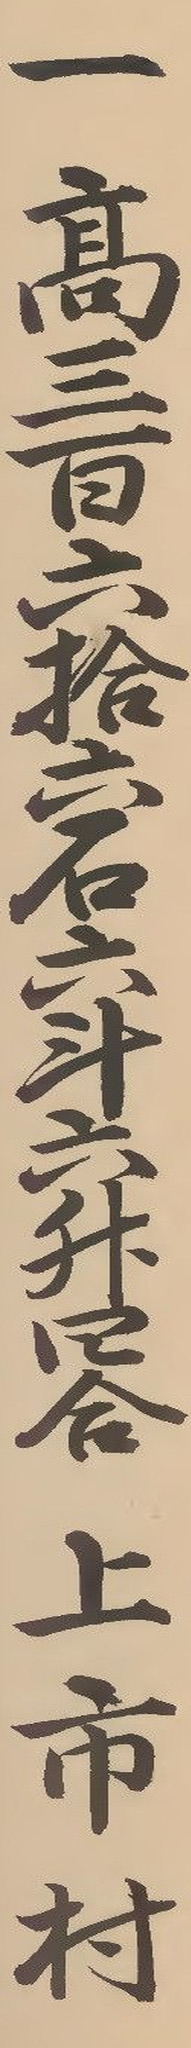一高三百六拾六石六斗六升四合上市村
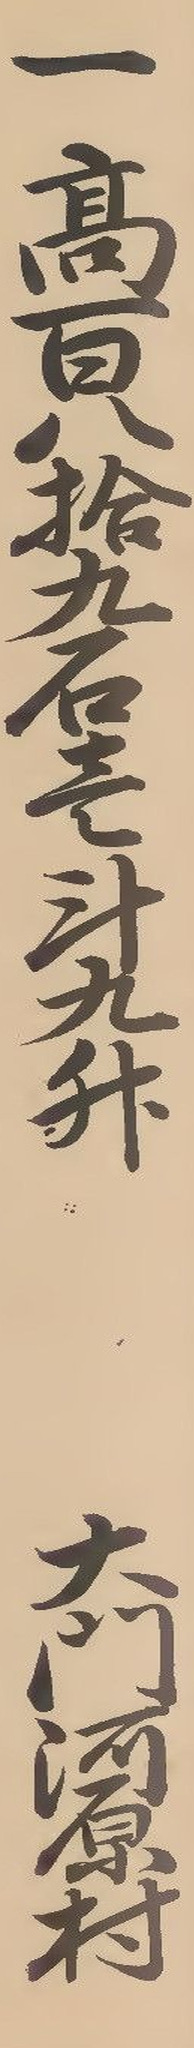一高百八拾九石壱斗九升大門河原村
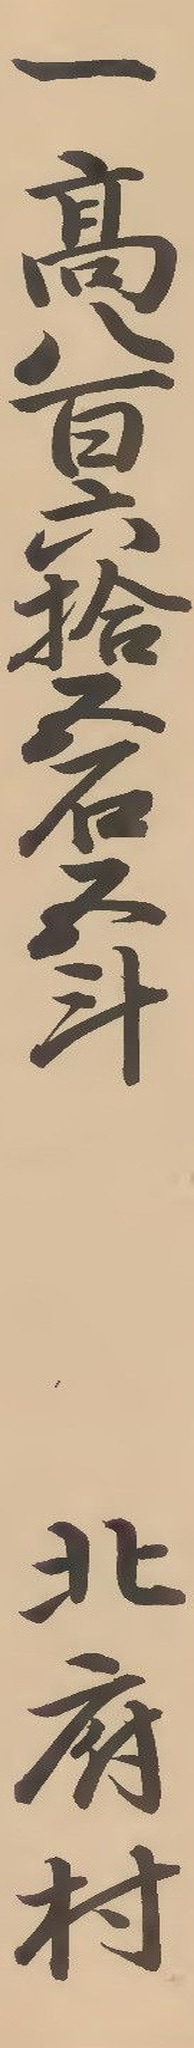一高八百六拾五石五斗北府村
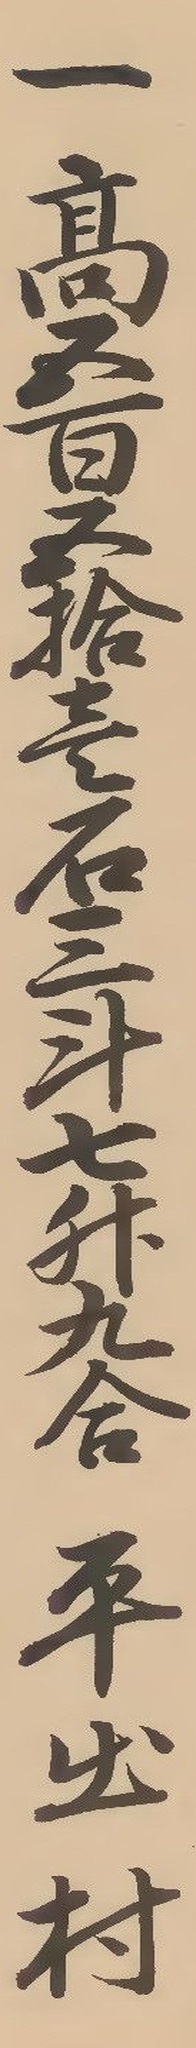一高五百五拾壱石三斗七升九合平出村
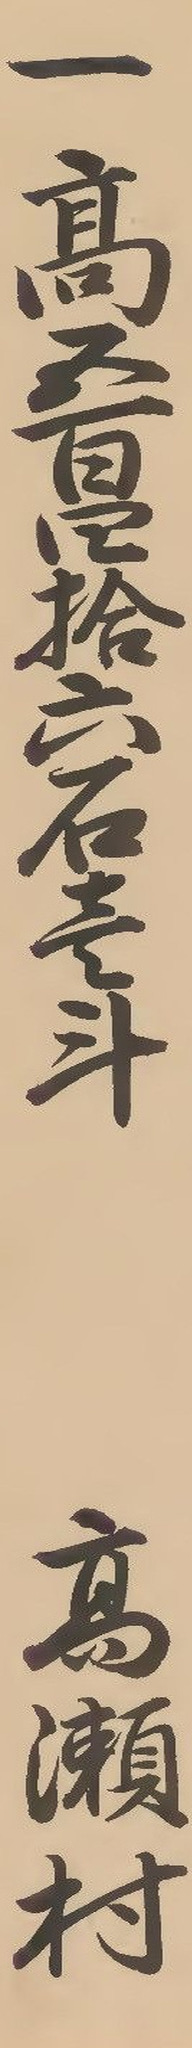一高五百四拾六石壱斗高瀬村

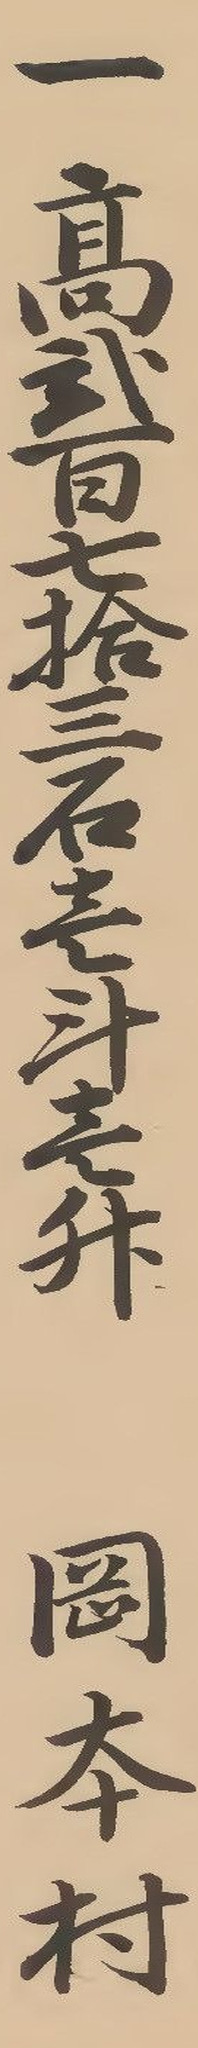一高弐百七拾三石壱斗壱升岡本村
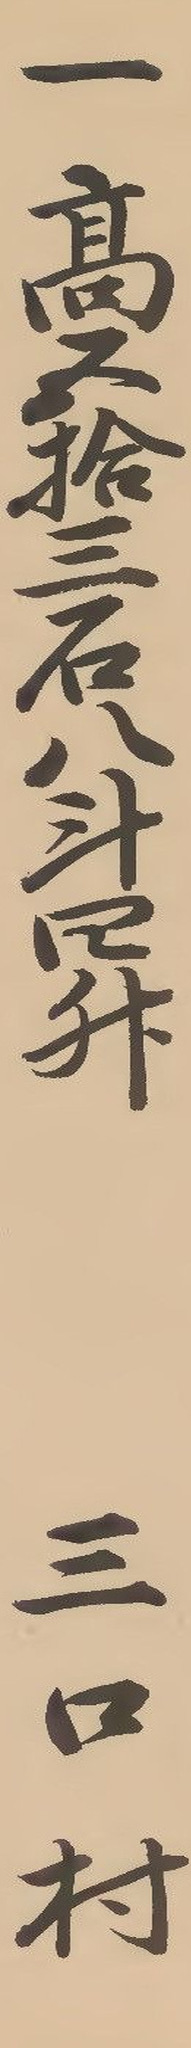一高五拾三石八斗四升三口村
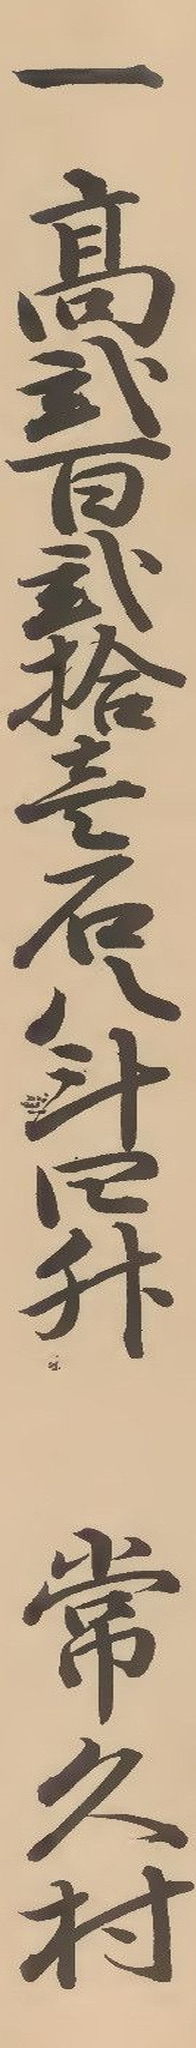一高弐百弐拾壱石八斗四升常久村
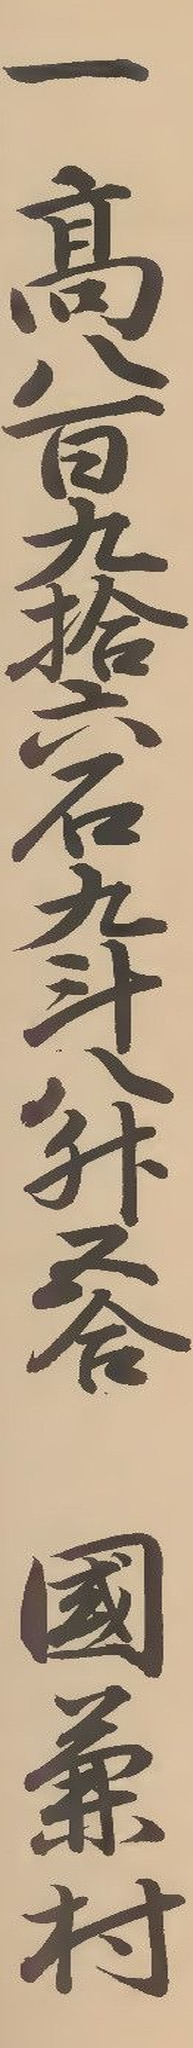一高八百九拾六石九斗八升五合国兼村
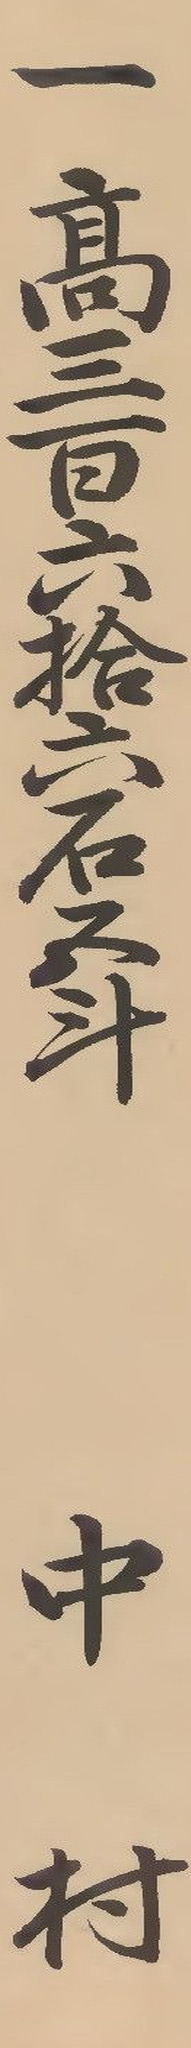一高三百六拾六石五斗中村
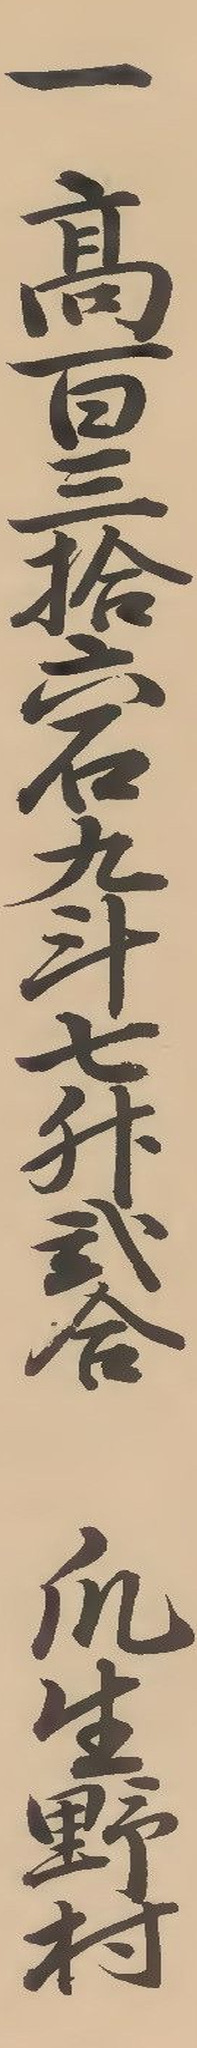一高百三拾六石九斗七升弐合瓜生野村
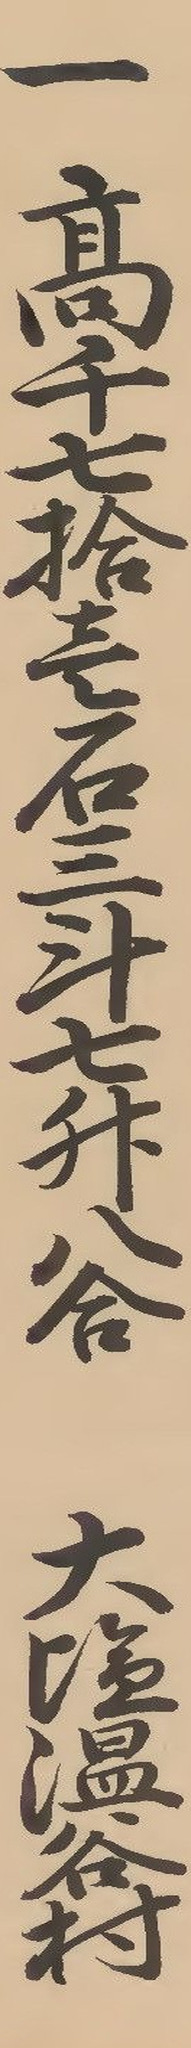一高千七拾壱石三斗七升八合大塩温谷村
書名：越前国郷帳
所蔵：国立公文書館 National Archives of Japan
